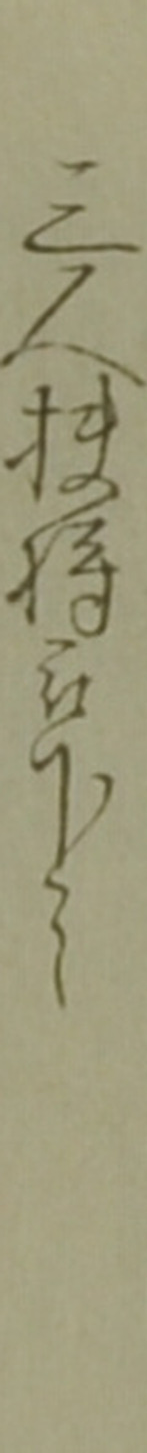三人扶持被下候
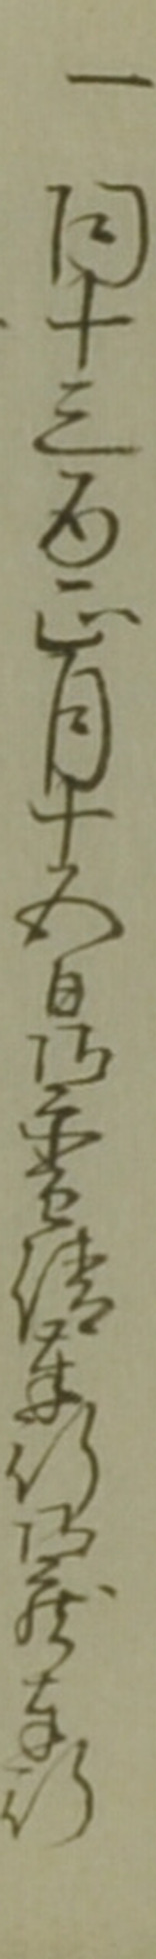一同十三丙正月十五日御普請奉行御蔵奉行
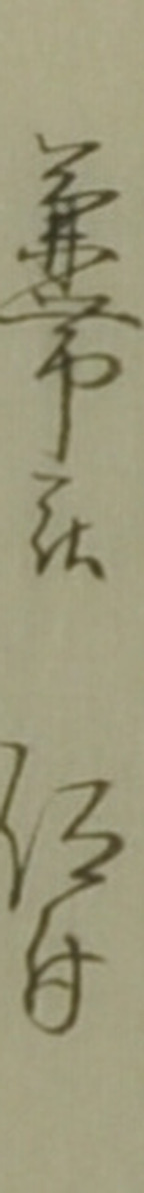兼帯被仰付
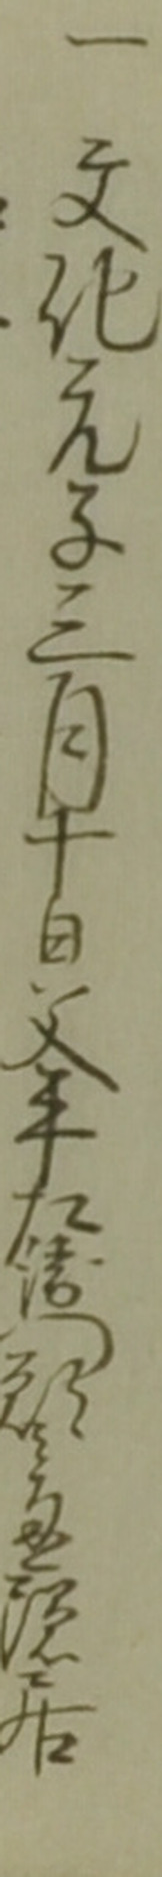一文化元子三月十日父平左衛門願之通隠居
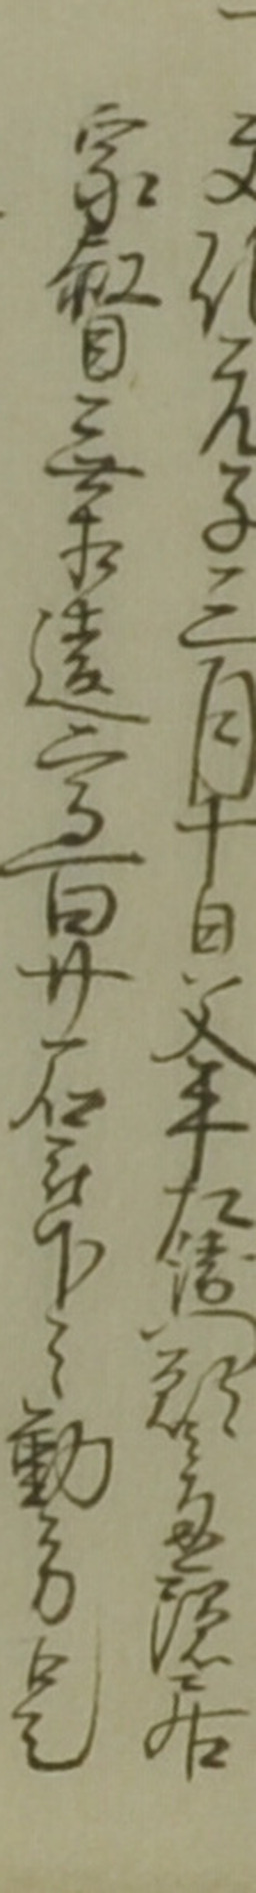家督無相違高百廿石被下候勤方是迄之通
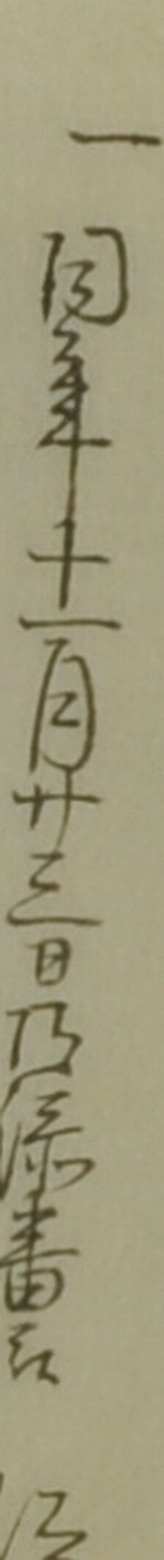一同年十一月廿三日御添番被仰付
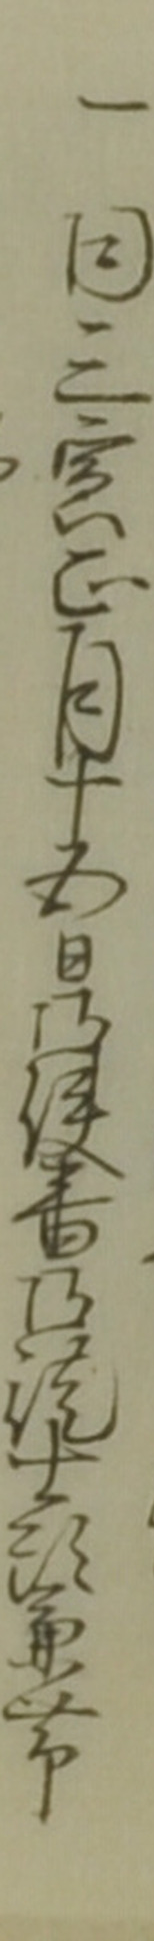一同三寅正月十五日御使番徒士頭兼帯
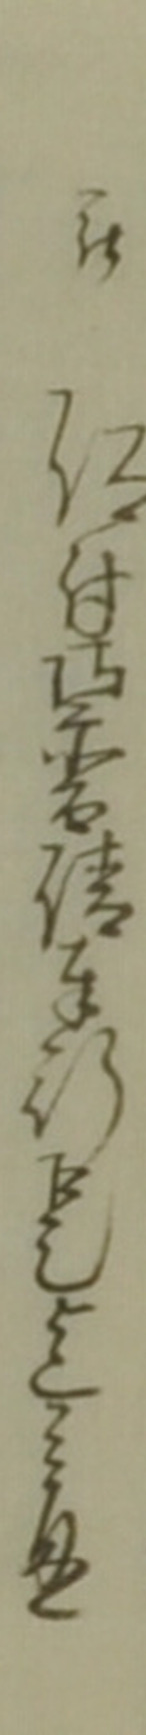被仰付御普請奉行是迄之通
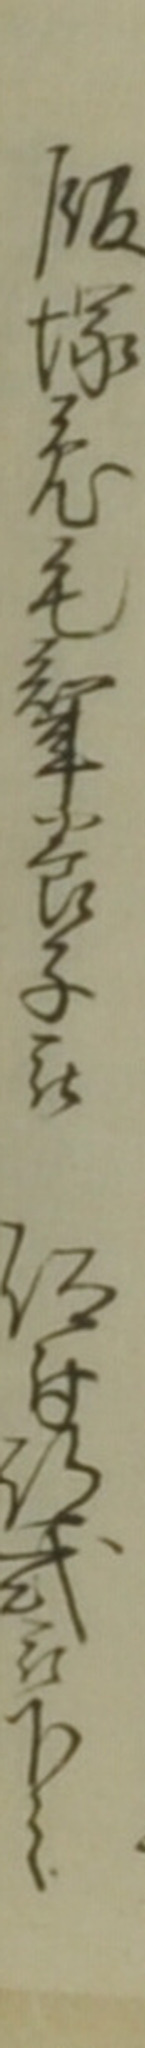飯塚兎毛聟養子被仰付役式被下候
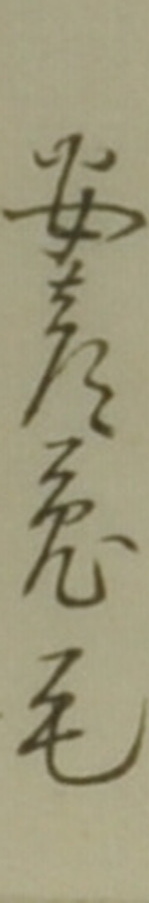安彦兎毛

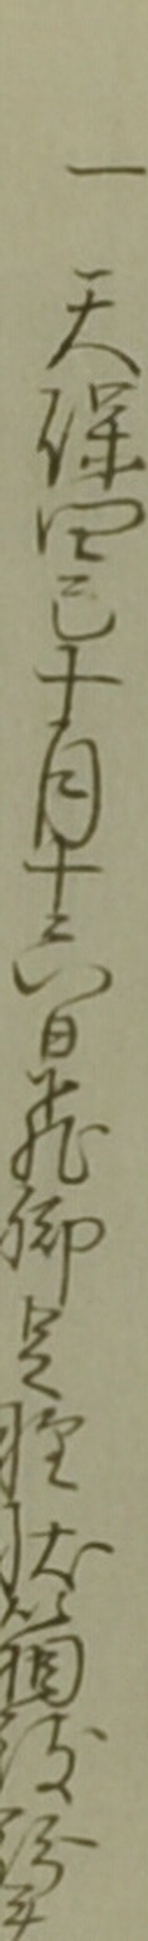一天保四巳十月十六日飛脚足軽状箱致紛失
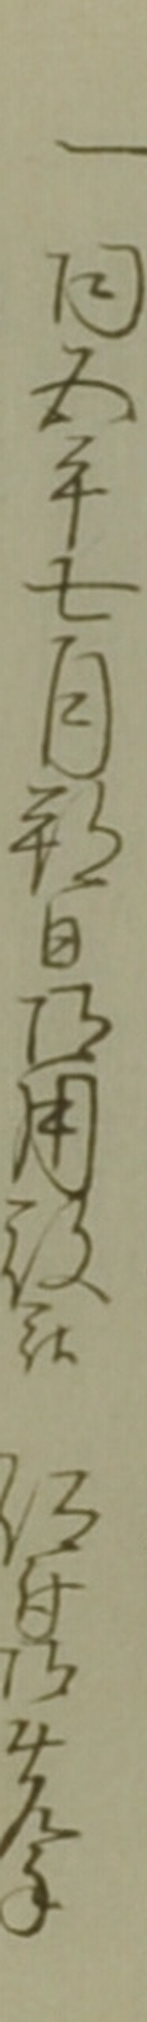一同五午七月朔日御用役被仰付御先手
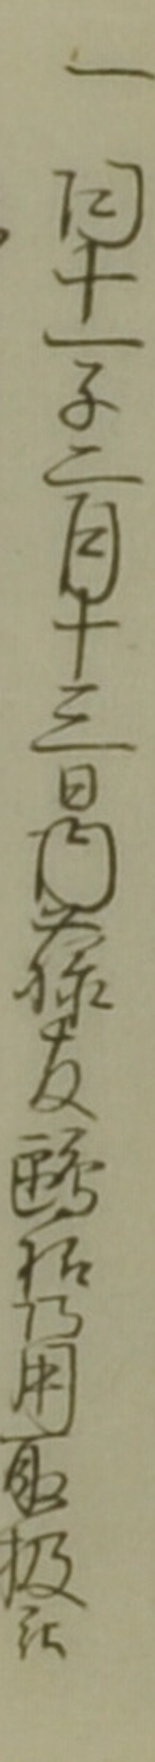一同十一子二月十三日内藤友鷗様御用取扱被
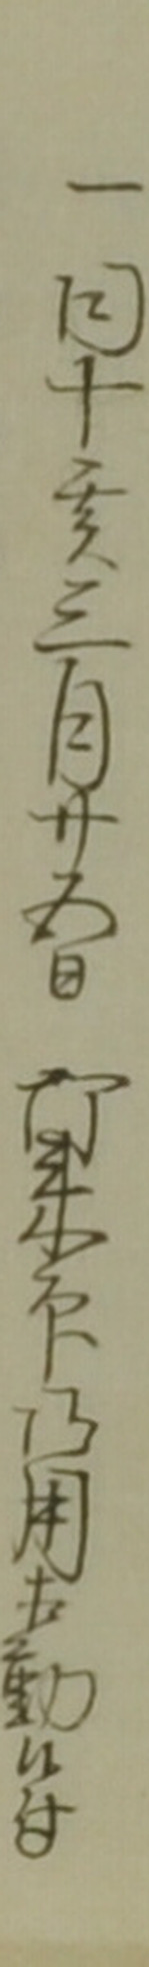一同十亥三月廿五日御朱印御用相勤候付
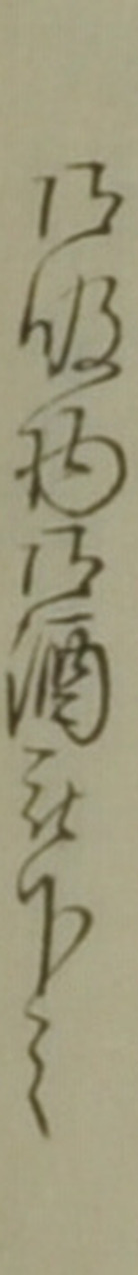御吸物御酒被下之
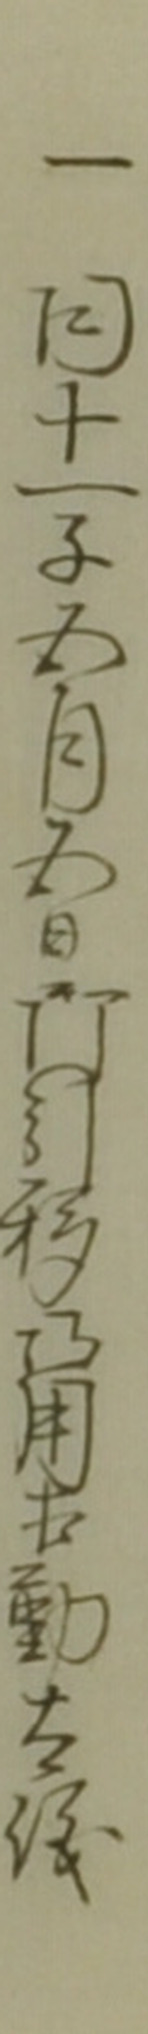一同十一子五月五日御引移御用相勤太儀
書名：給人諸士勤仕録（三）
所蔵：伊那市立高遠町図書館・合同会社AMANE
